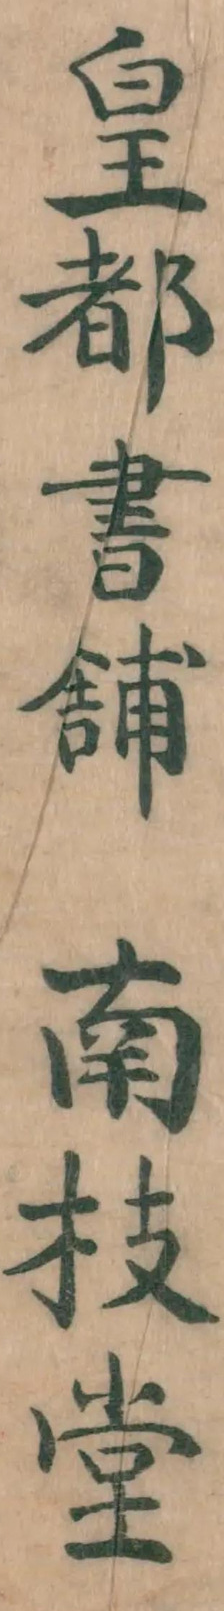皇都書舗南枝堂
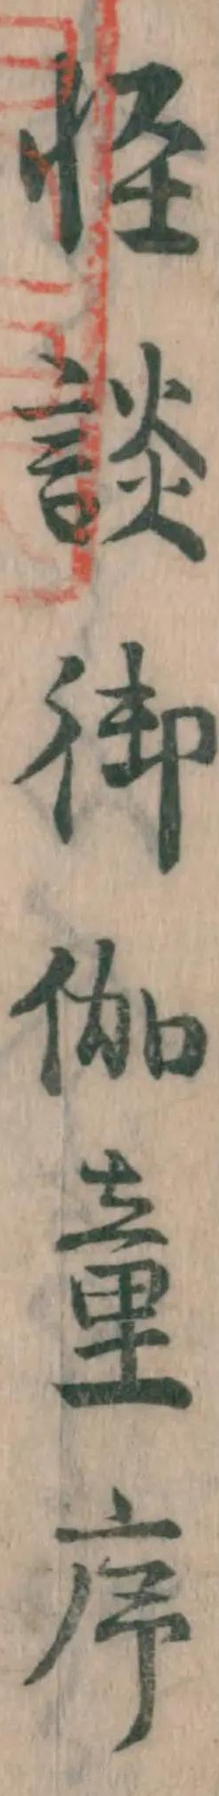怪談御伽童序
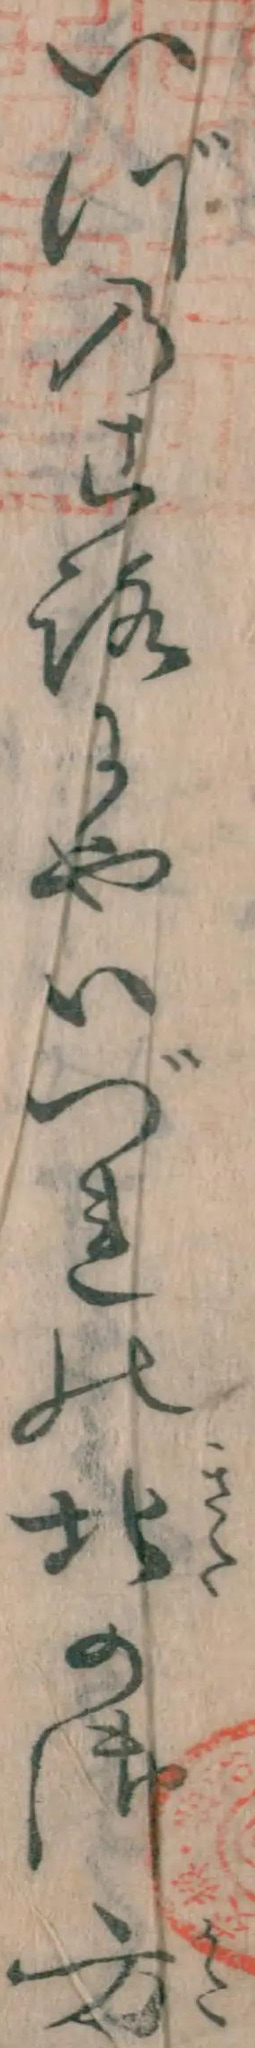いづのころにやいづれの北の御方
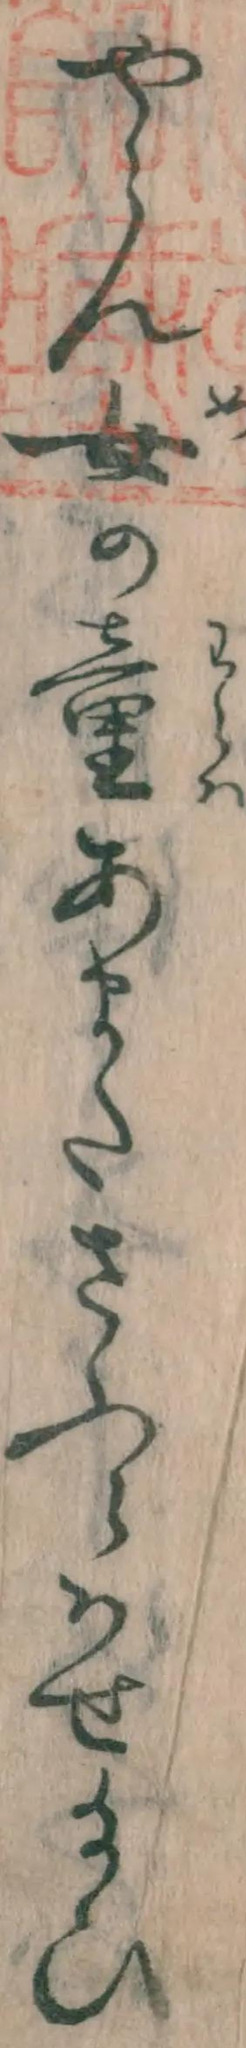やらん女の童あまたさふらはせ給ひ
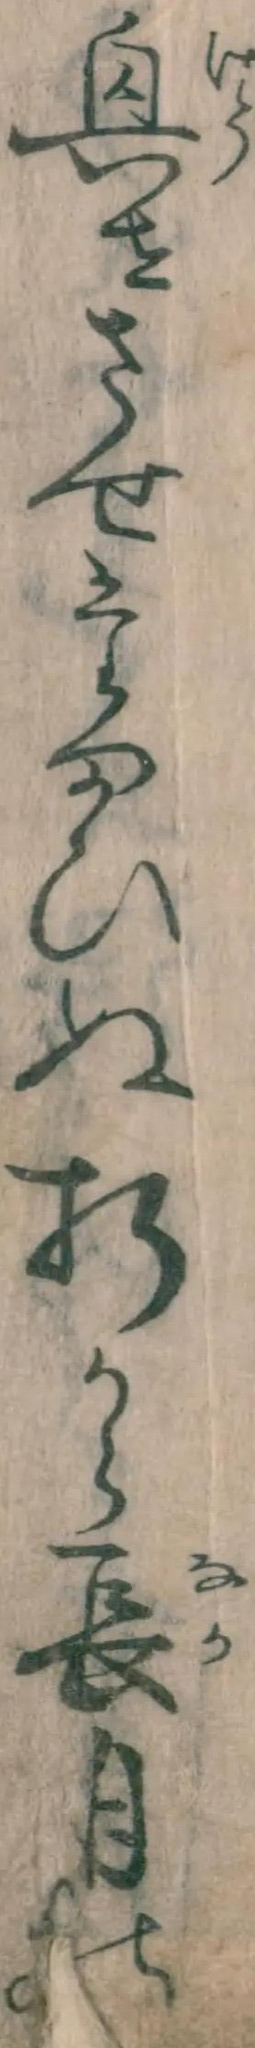興せさせたまひぬ折から長月の
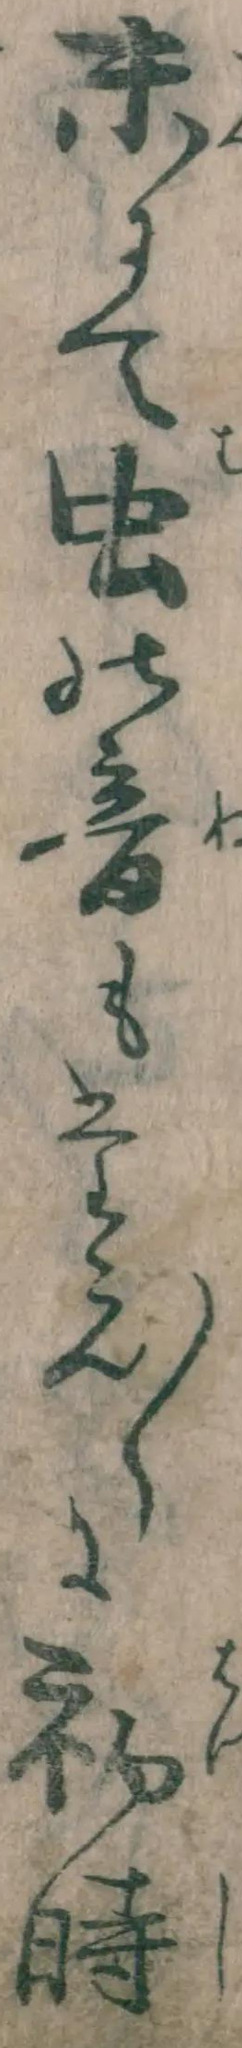末にて虫の音もたえ〳〵に初時
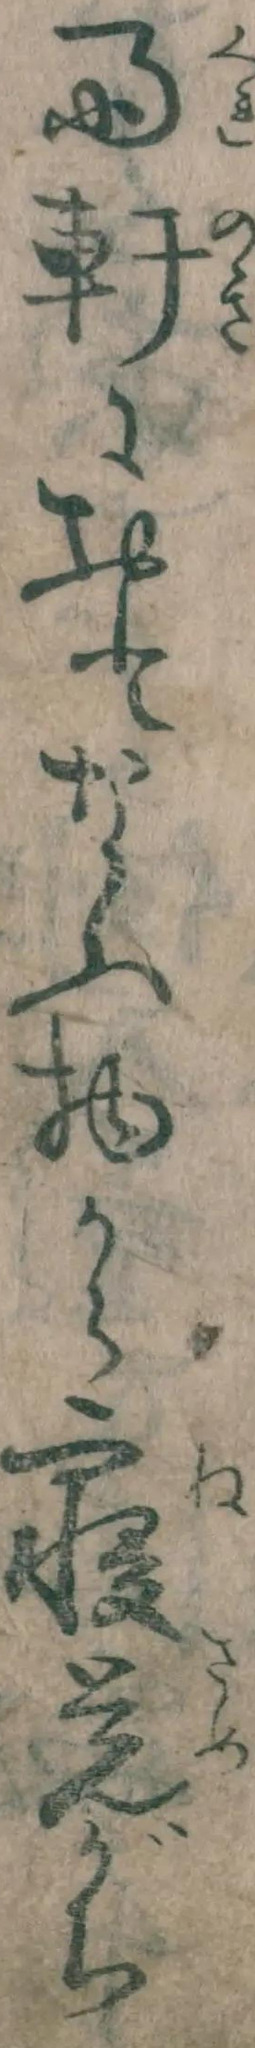雨軒におとなふ物から寝覚がち

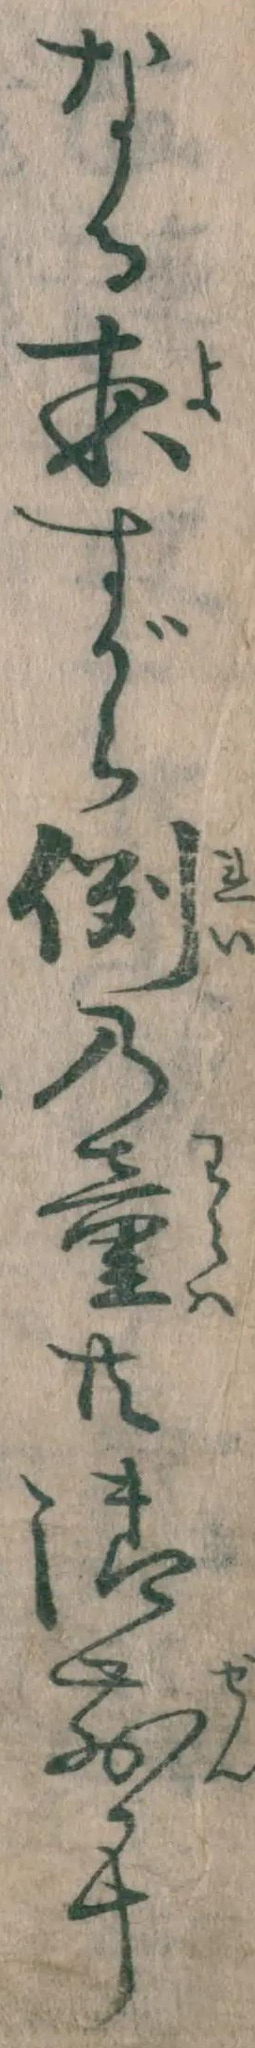なる夜すがら例の童共御前に
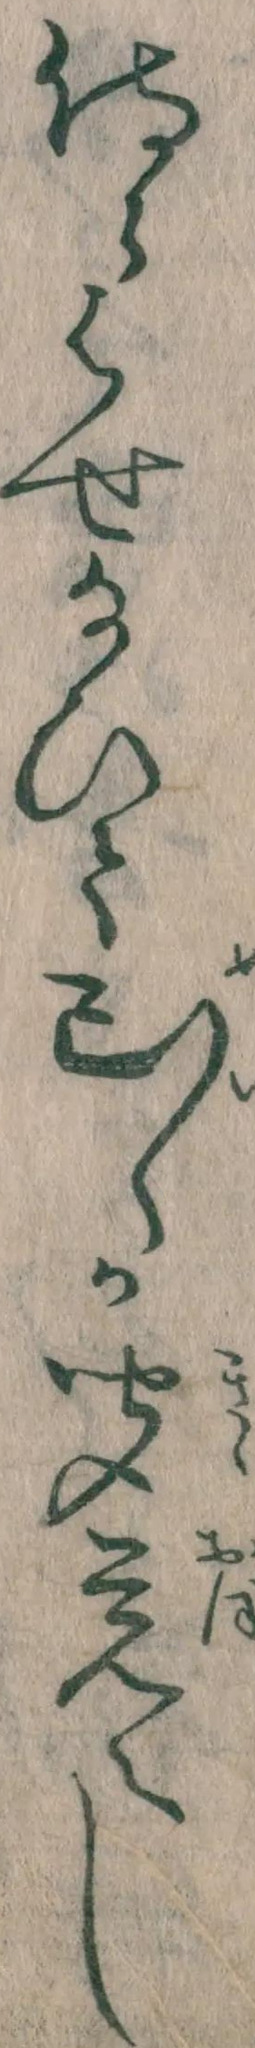侍らせ給ひて己〳〵か聞覚へし
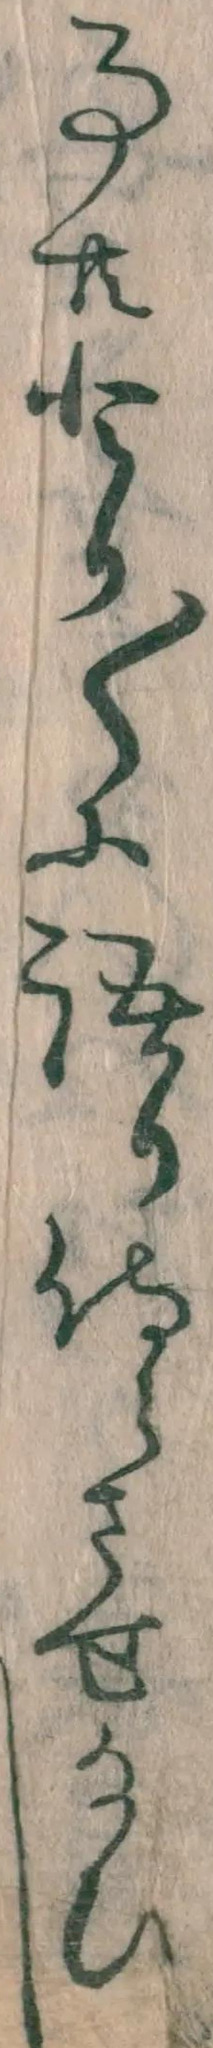事共とり〳〵に語り侍らさせ給ひし
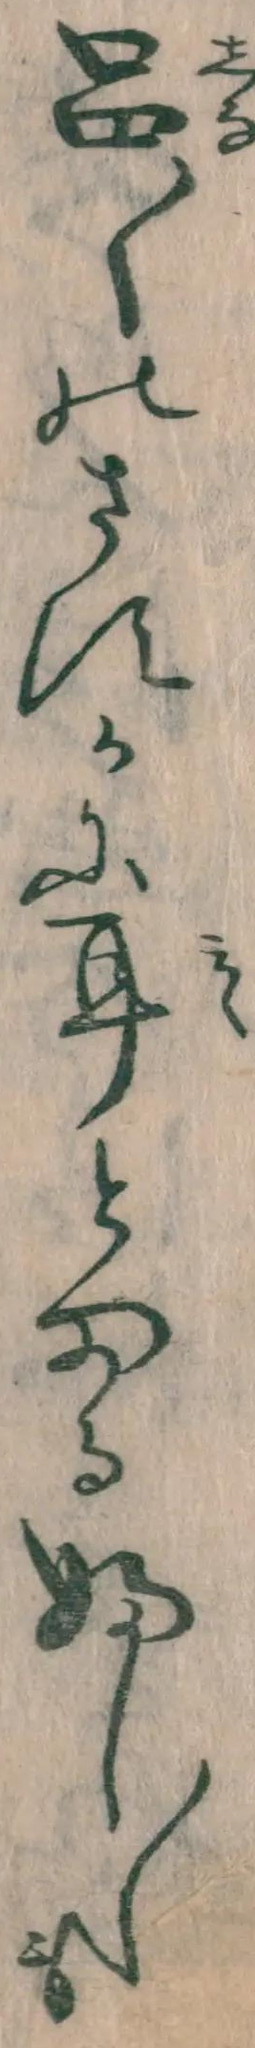品〳〵のさすかに耳とまるふしき？
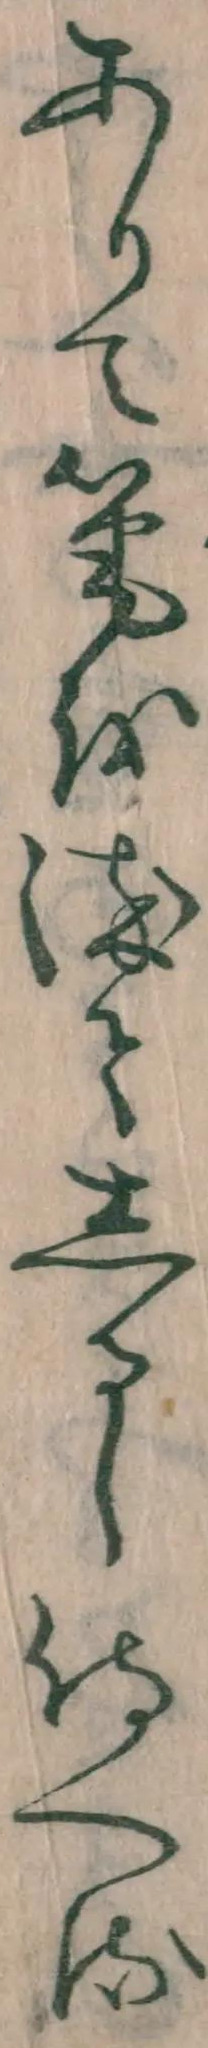ありて筆を染てしるし侍へる
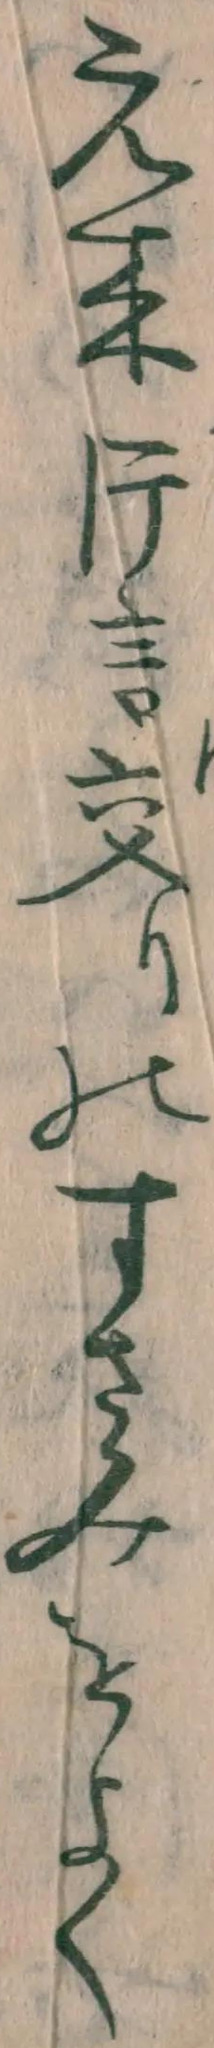元来片言交りのすさみをよく
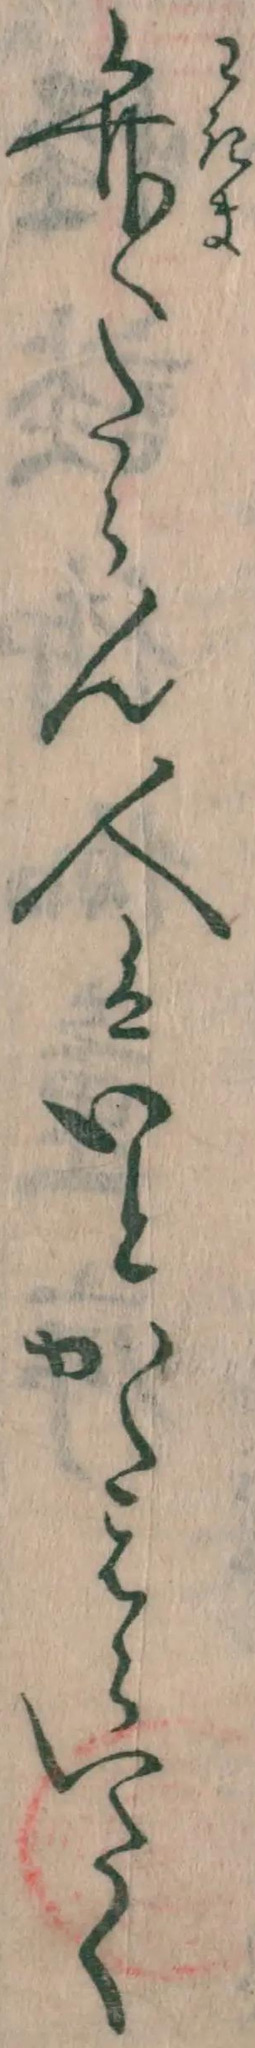弁へたらん人はいとかゝ？みらいたく
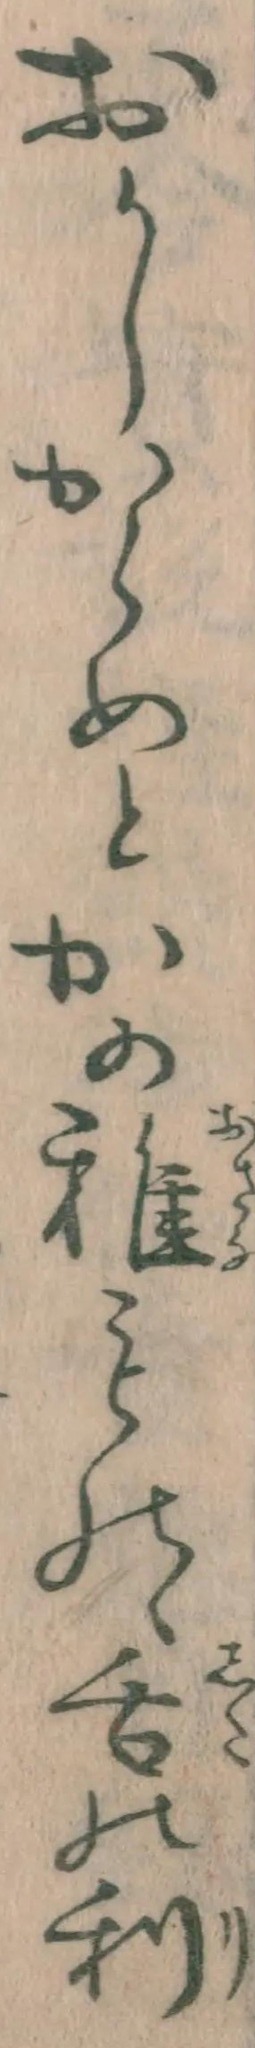おかしからめとかの稚ものゝ舌の利
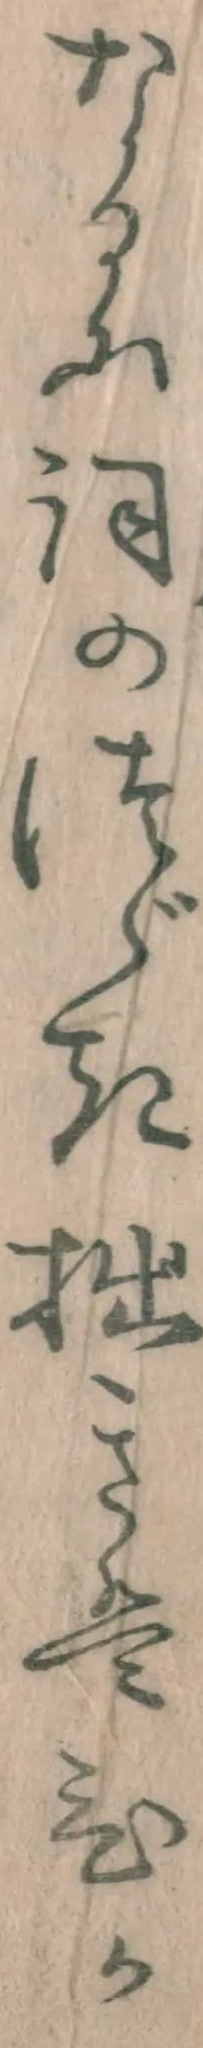なるに詞のつゞき拙きはひか
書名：怪談御伽童 5巻. [1]
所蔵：国立国会図書館 National Diet Library, JAPAN
